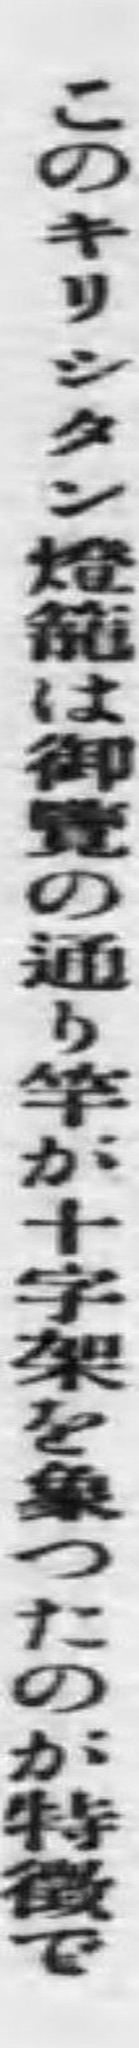このキリシタン灯籠は御覧の通り竿が十字架を象つたのが特徴で
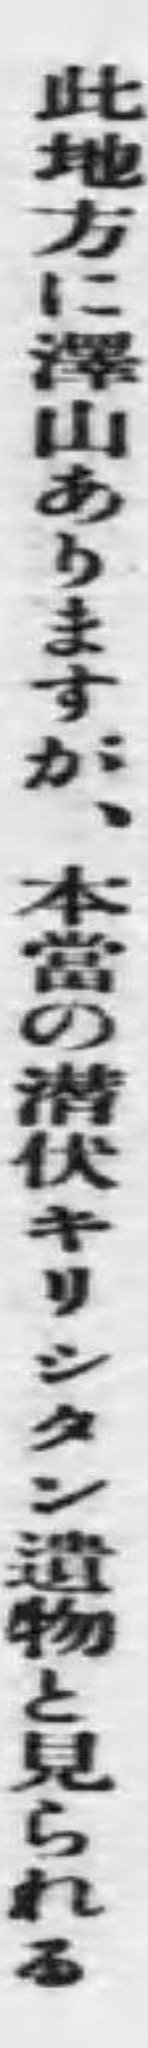此地方に沢山ありますが、本当の潜伏キリシタン遺物と見られる
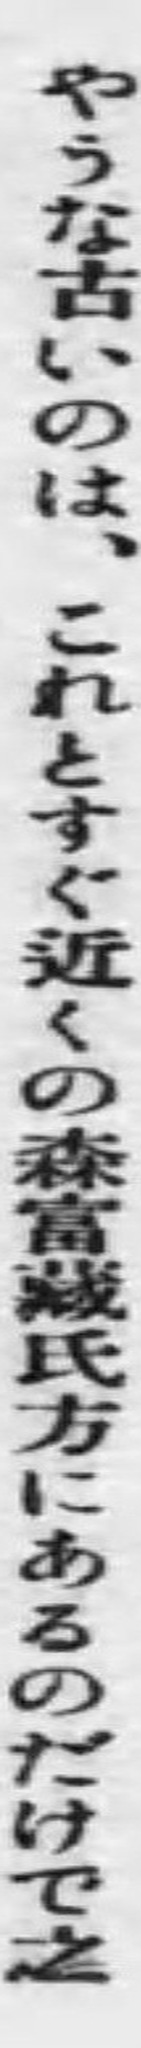やうな古いのは、これとすぐ近くの森富蔵氏方にあるのだけで之
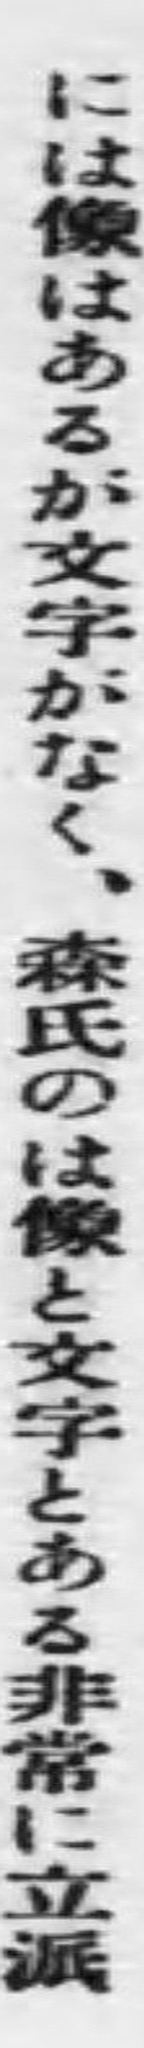には像はあるが文字がなく、森氏のは像と文字とある非常に立派
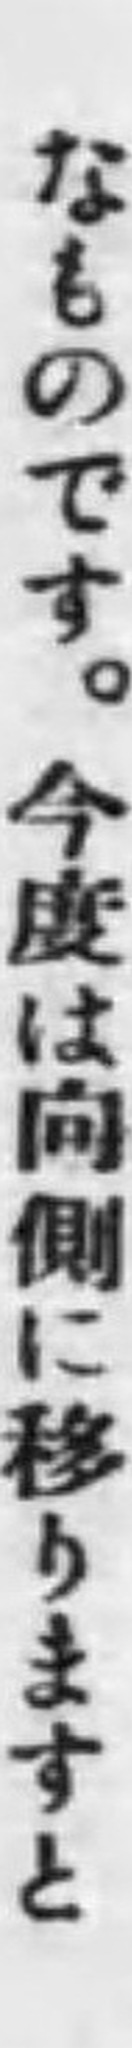なものです。今度は向側に移りますと
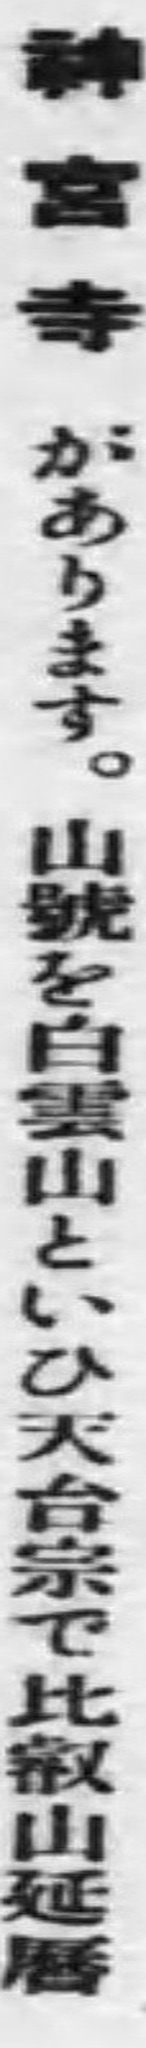神宮寺があります。山号を白雲山といひ天台宗で比叡山延暦
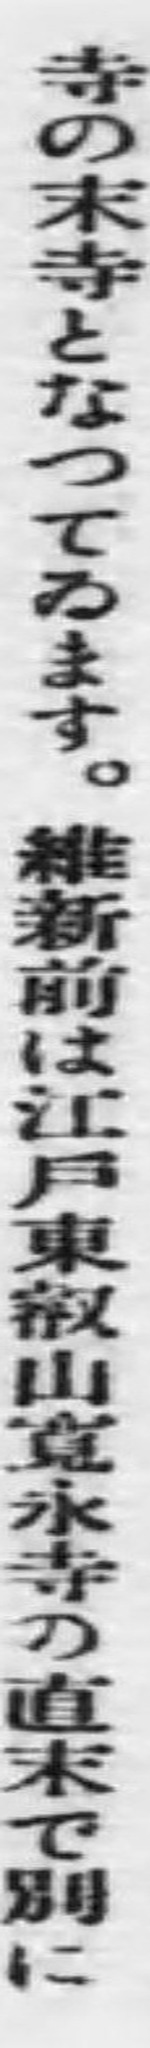寺の末寺となつてゐます。維新前は江戸東叡山寛永寺の直末で別に
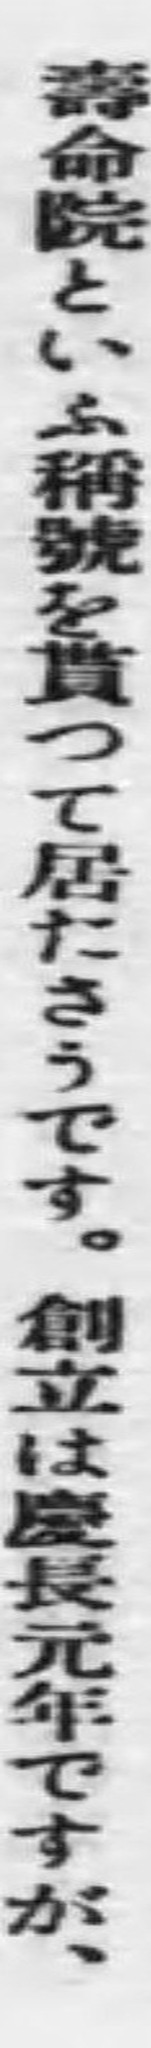寿命院といふ称号を貰つて居たさうです。創立は慶長元年ですが、
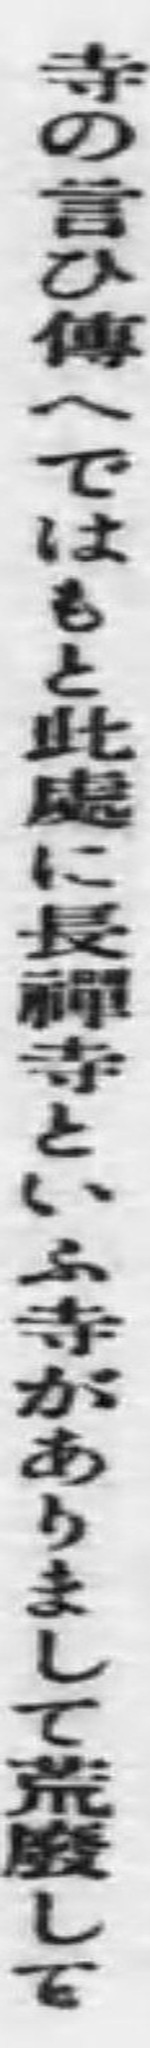寺の言ひ伝へではもと此処に長禅寺といふ寺がありまして荒廃して
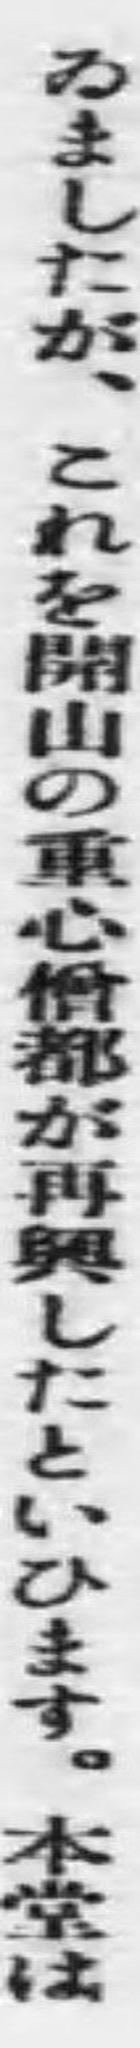ゐましたが、これを開山の重心僧都が再興したといひます。本堂は

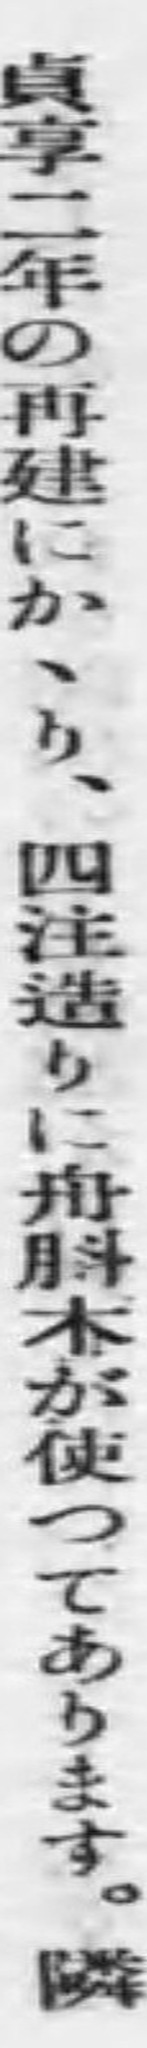貞享二年の再建にかゝり、四注造りに舟肘木が使つてあります。隣
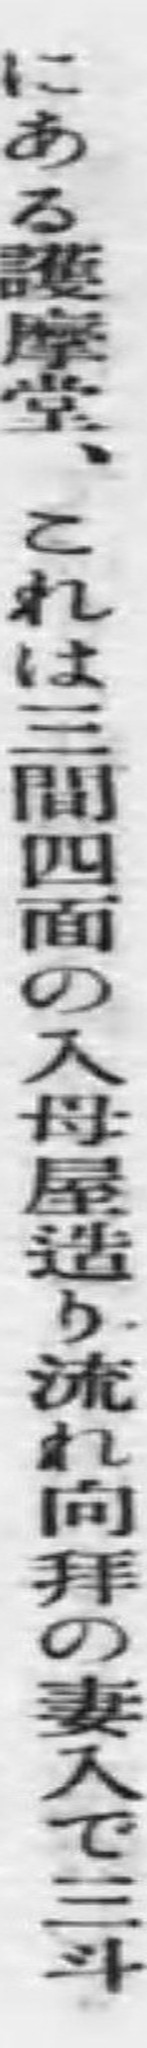にある護摩堂、これは三間四面の入母屋造り流れ向拝の妻入で三斗
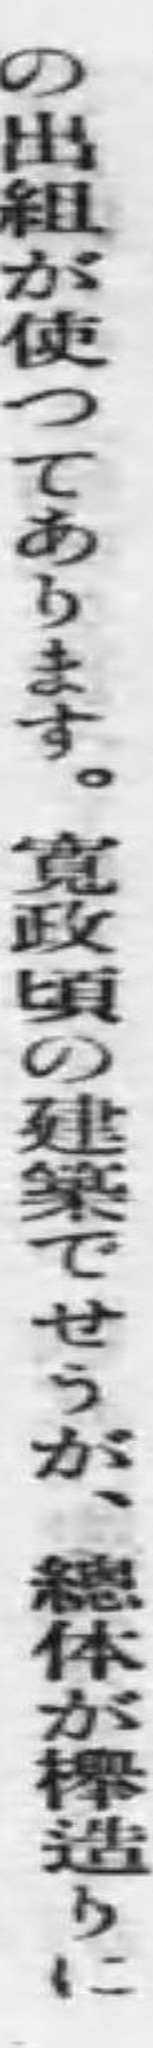の出組が使つてあります。寛政頃の建築でせうが、総体が欅造りに
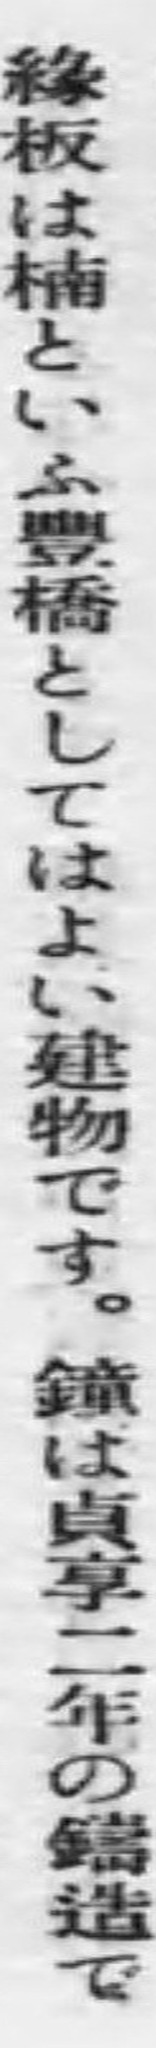縁板は楠といふ豊橋としてはよい建物です。鐘は貞享二年の鋳造で
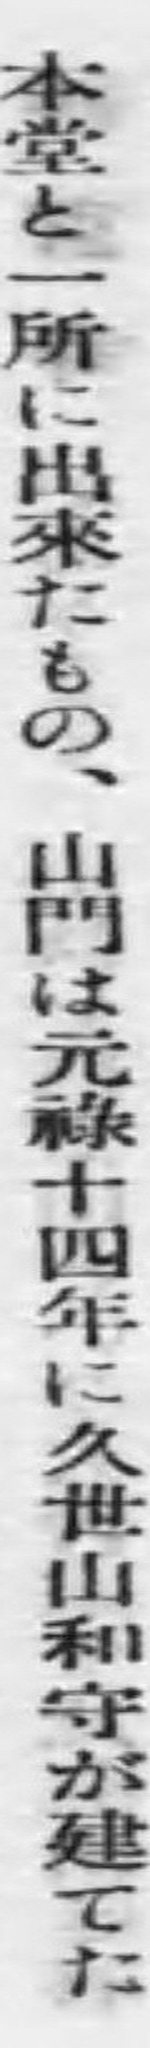本堂と一所に出来たもの、山門は元禄十四年に久世山和守が建てた
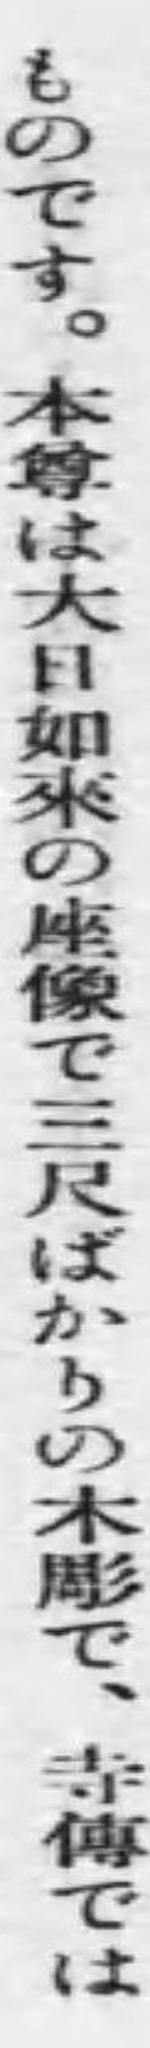ものです。本尊は大日如来の座像で三尺ばかりの木彫で、寺伝では
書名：東三河道中記 : 豊橋市及其附近案内
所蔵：国立国会図書館 National Diet Library, JAPAN
